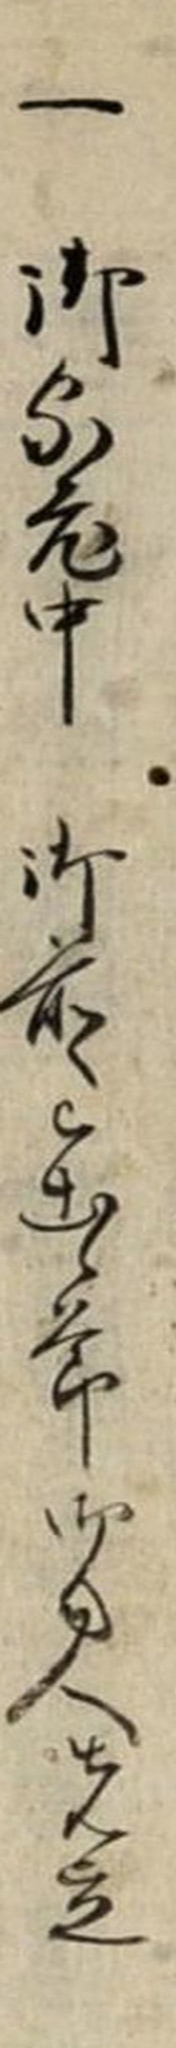一御家老中御前へ被出候節御用人先立
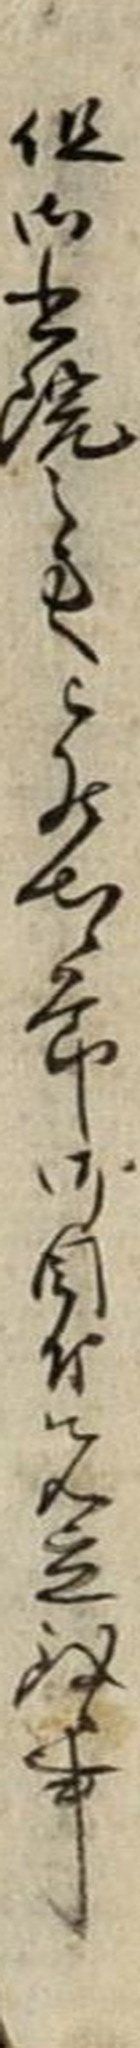但御書院之方へ被罷出候節御目付先立致候事
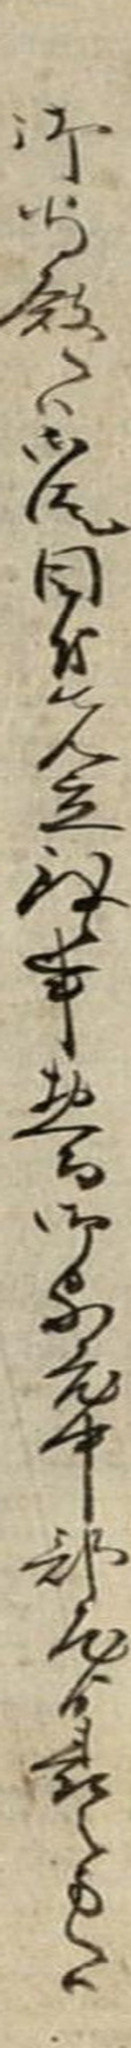御守殿へは御徒目付先立致候事惣て御家老中部屋ゟ表之方へは
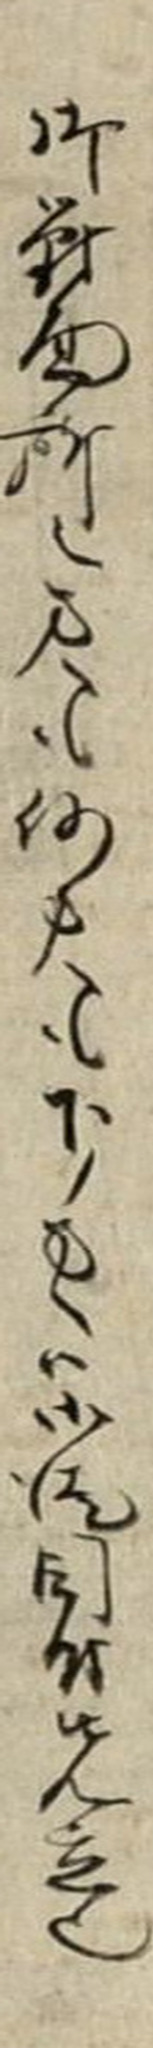御対面所之方へも何方へも下之方へは御徒目付先立也
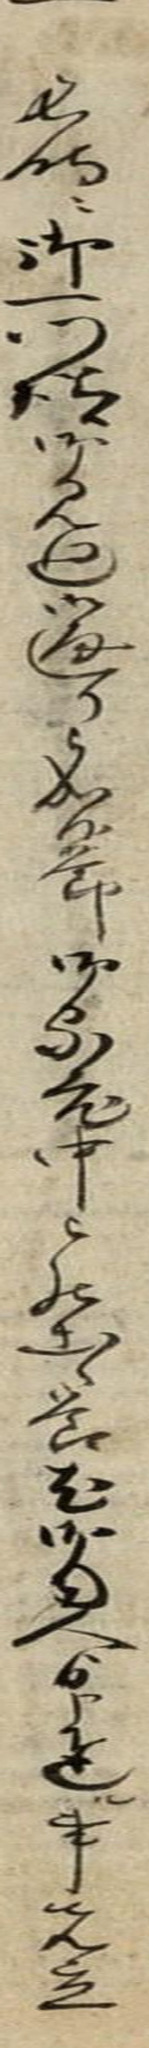一不時に御一門様御見廻御通り被成候節御家老中被罷出候節尤御用人ゟ申達る事先立
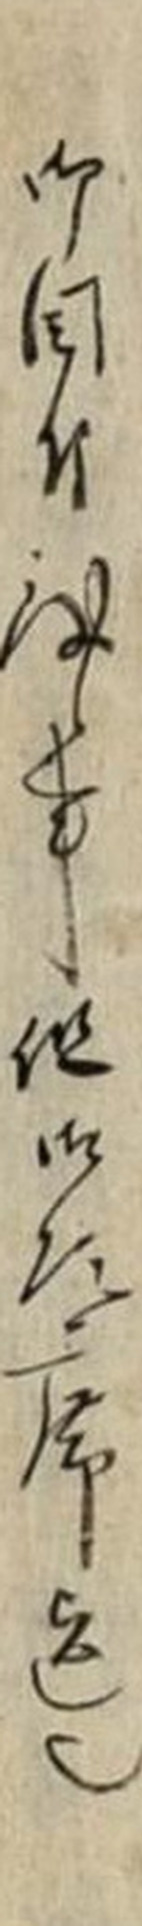御目付致候事但御次席迄也
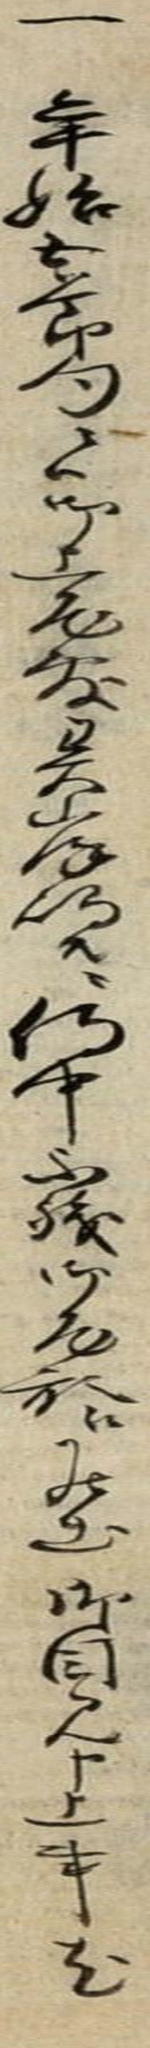一年始五節句には御上屋敷霊岸嶋共に侍中不残御屋形へ罷出御目見申上事尤
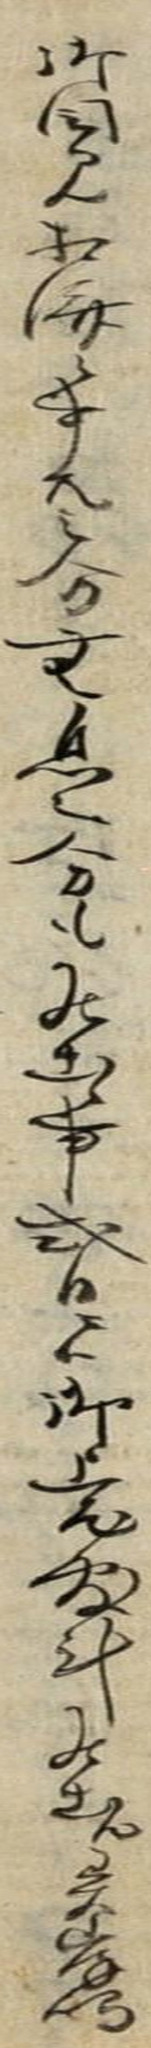御目見相済候事共之分無息之分も罷出候事式日には御上屋敷計罷出る霊岸嶋
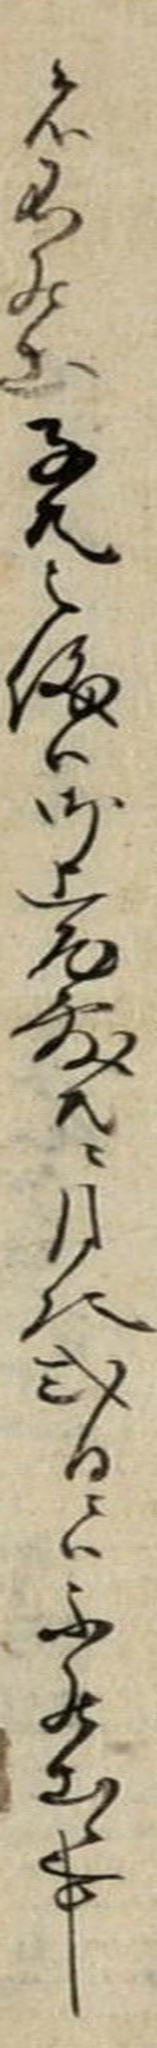には不罷出子共之儀は御上屋敷共に月次式日には不罷出候事
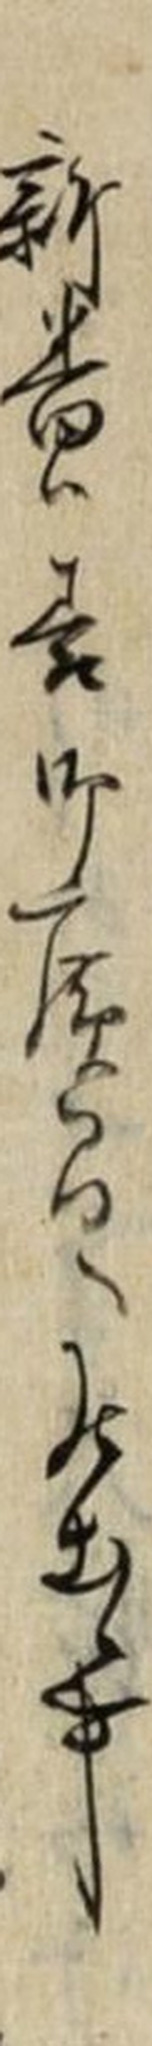新番は表御広間へ罷出候事
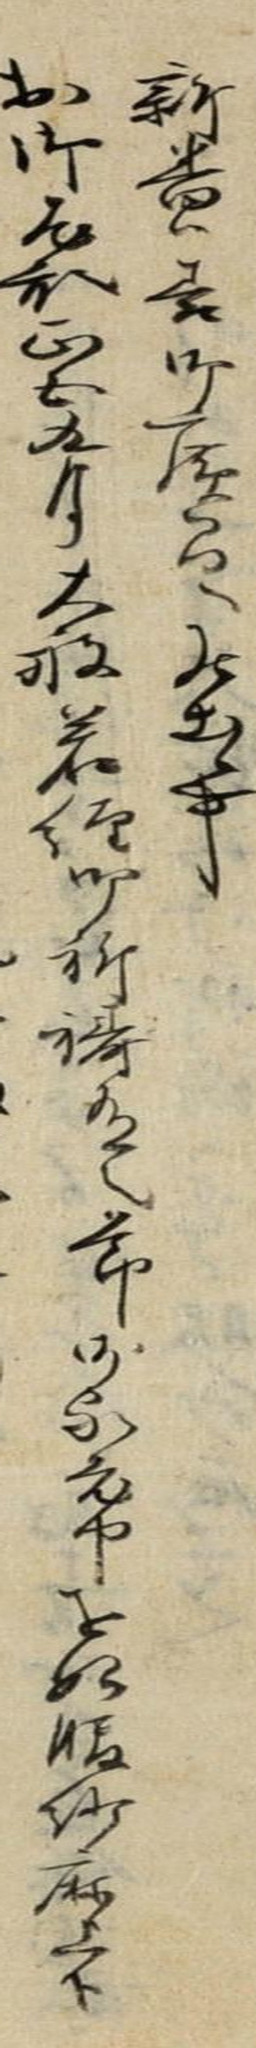一於御屋形正五九月大般若経御祈祷有之節御家老中を始服紗麻上下
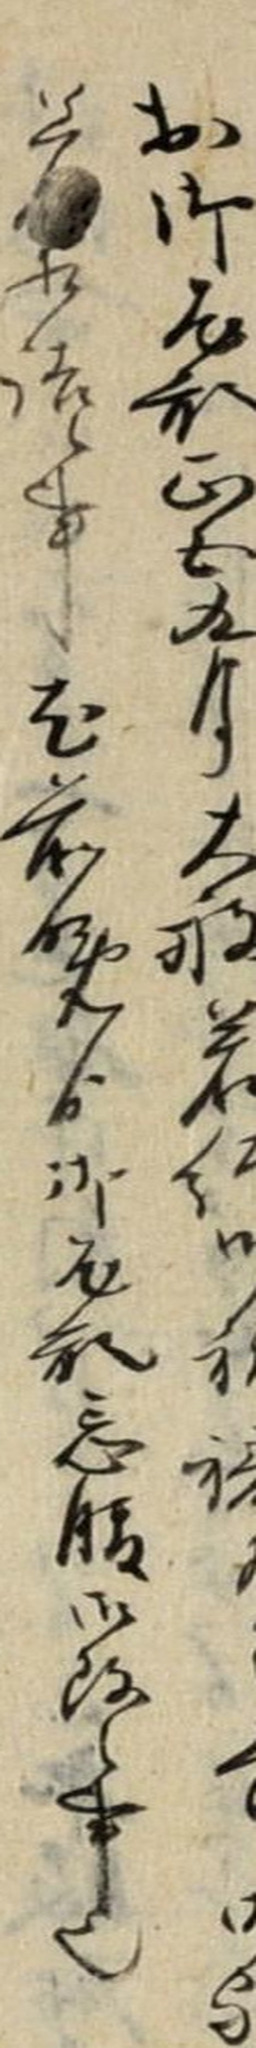着相詰候事尤前晩ゟ御屋形忌服御改之事也
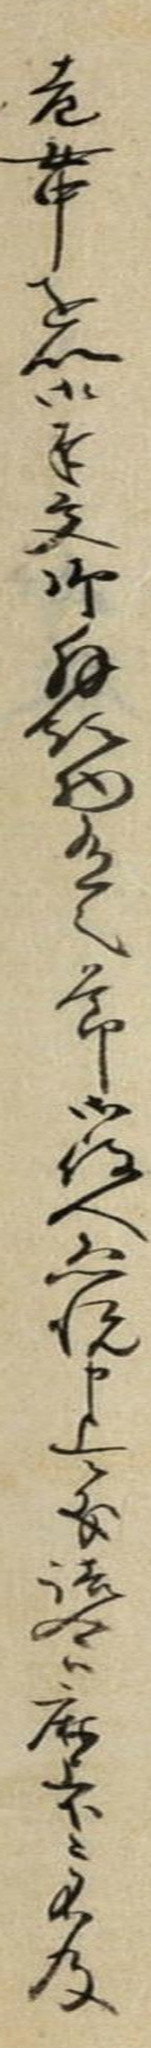一老女中を以御奉文御拝領物有之節御役人恐悦申上候義詰合は麻上下に不及
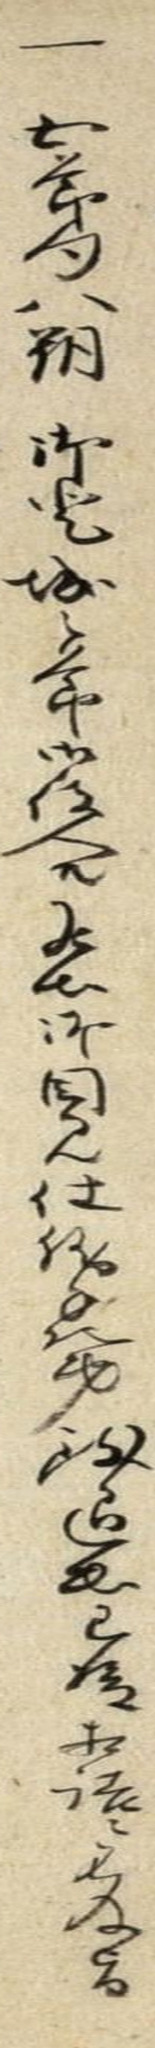一五節句八朔御登城之節御役人共罷出御目見仕勝手次第致退出已後相詰に不及旨
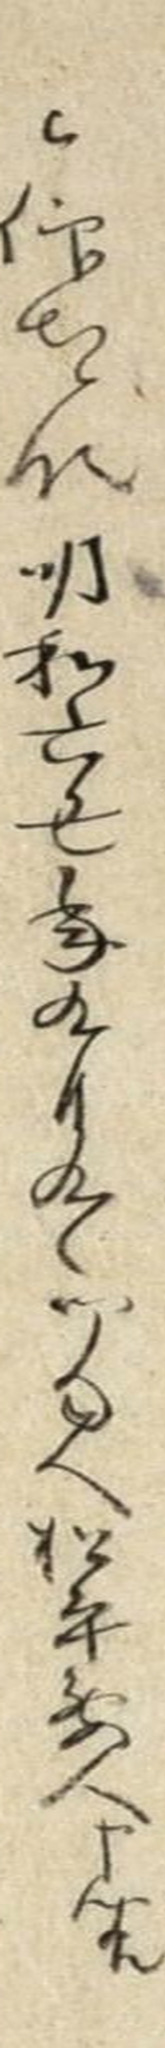被仰出候段明和六丑年九月九日御用人松平要人申聞る
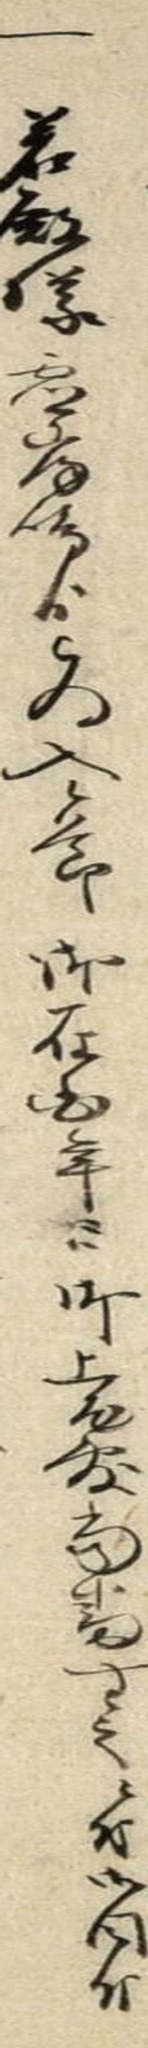一若殿様霊岸嶋ゟ被為入候節御在国年には御上屋敷当番無之に付御目付
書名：三都并道中之部
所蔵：福井県文書館 Fukui Prefectural Archives
